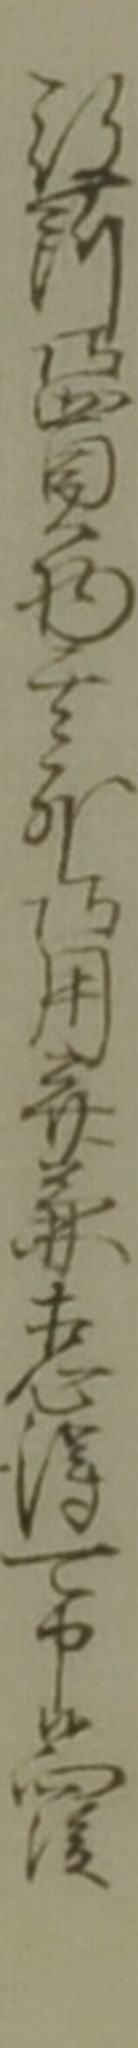役所御買物其外御用弁兼相心得可申候向後

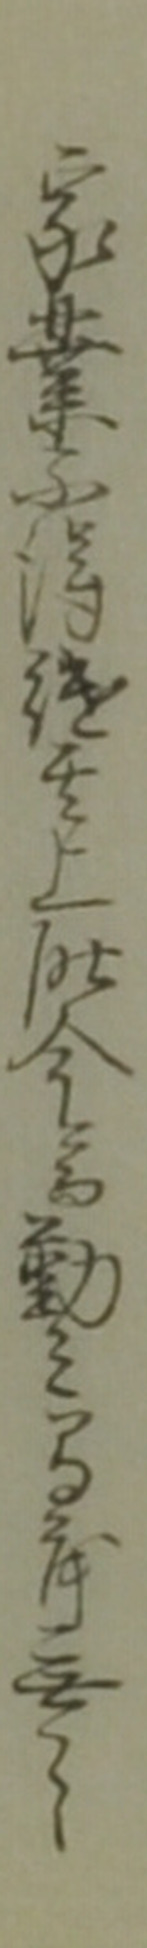家業不得継其上昨今ニ而勤之間茂無之
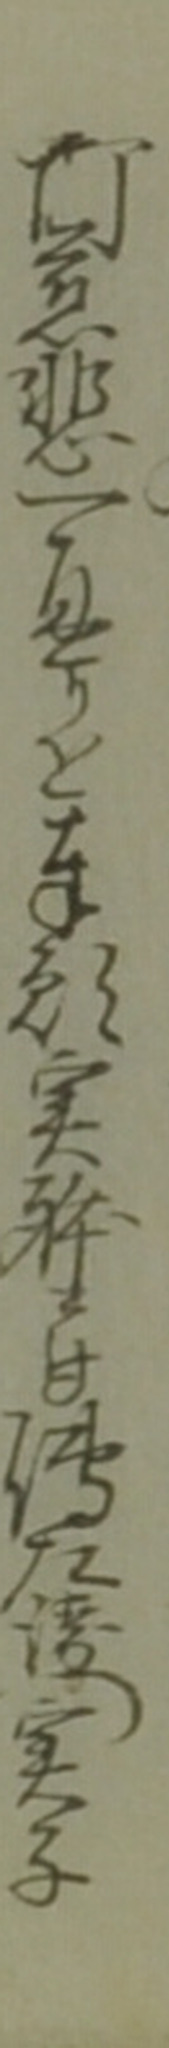御慈悲一通リを奉願実躰ニ付伝左衛門実子
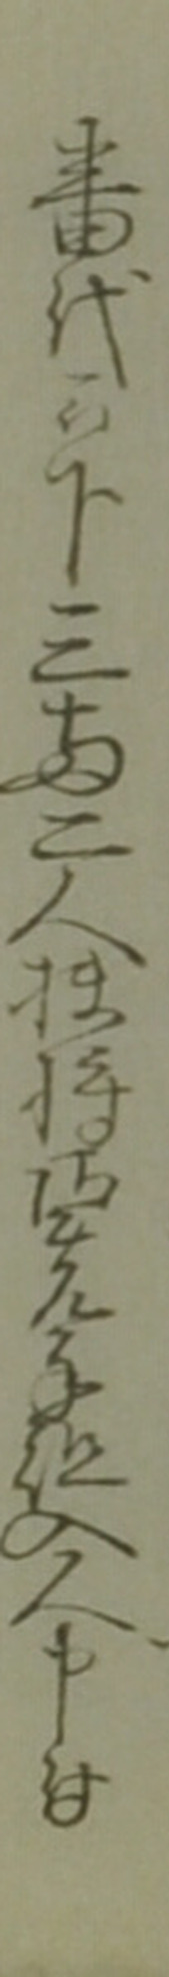番代被下三両二人扶持御先手組入人申付
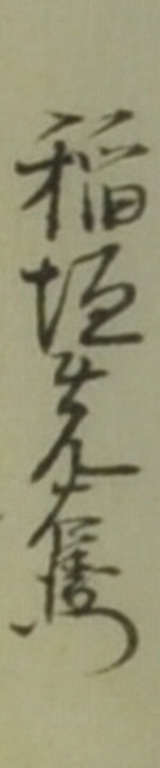稲垣先右衛門

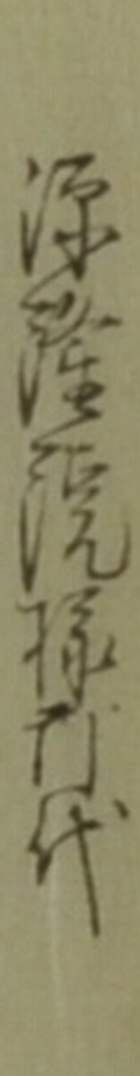源隆院様御代
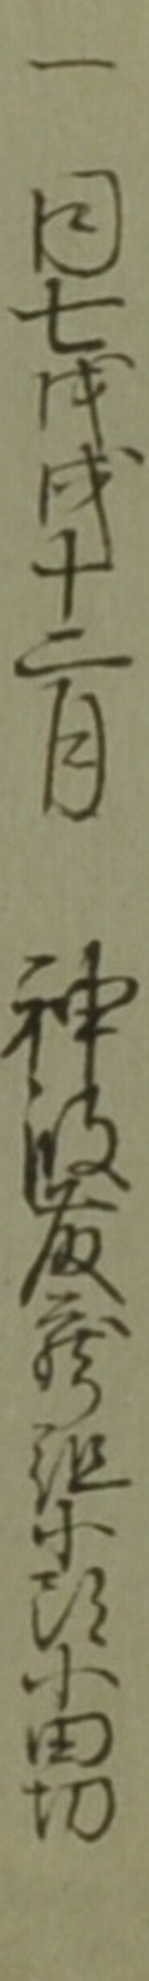一同七戊戌十二月神波藤蔵組小頭小田切
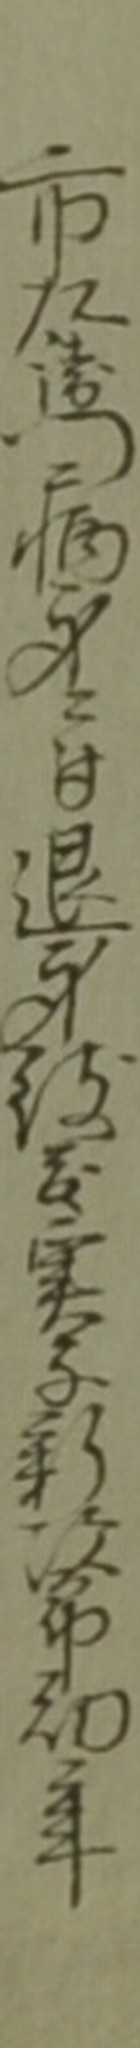市左衛門病身ニ付退身致度実子新次郎幼年
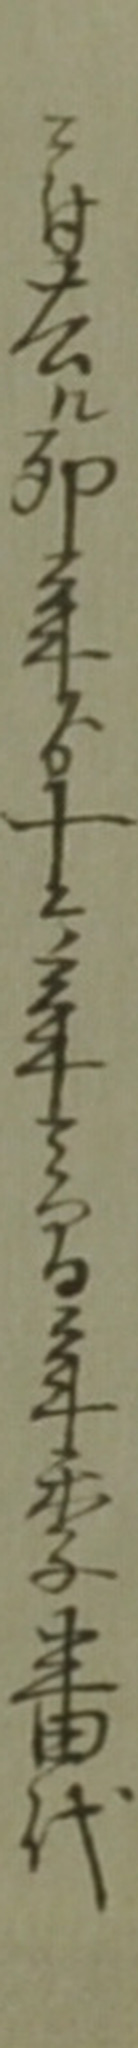ニ付去ル卯年ゟ十ヶ年之間年季番代
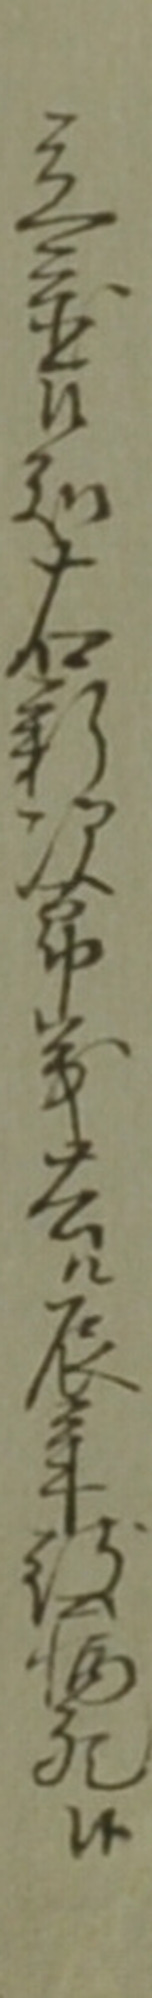立置候処右新次郎義去ル辰年致病死候
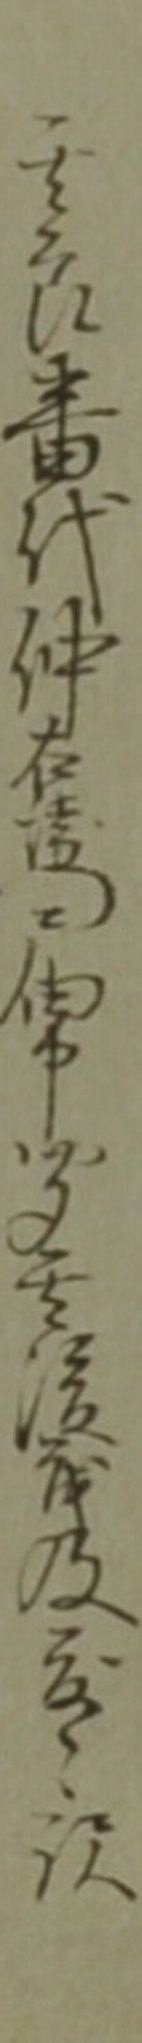其節番代仲右衛門届申聞其後茂及度々訳
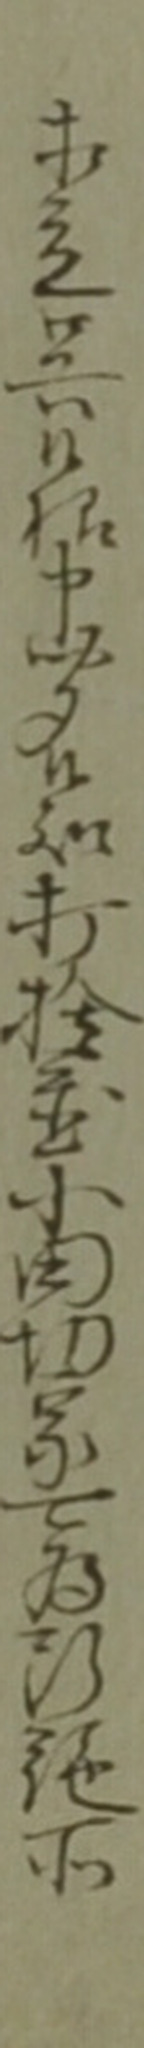相立呉候様申聞候処打捨置小田切家可為断絶所
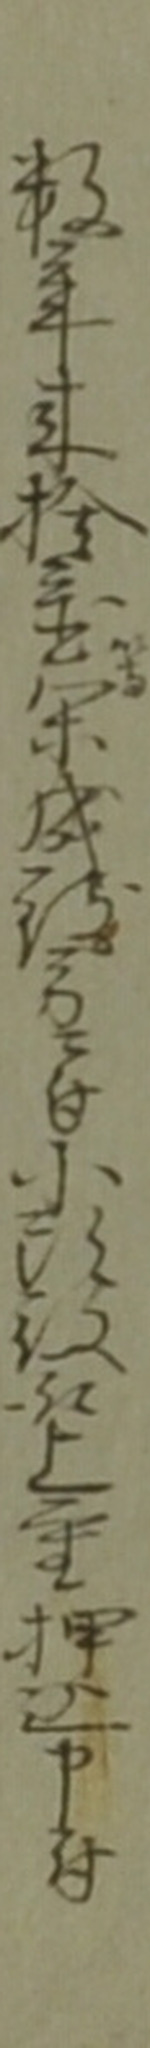数年来捨置閑成致方ニ付小頭役取上金押込申付
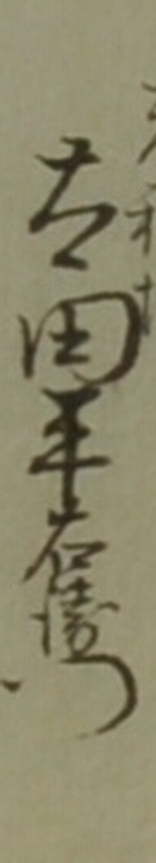太田平右衛門
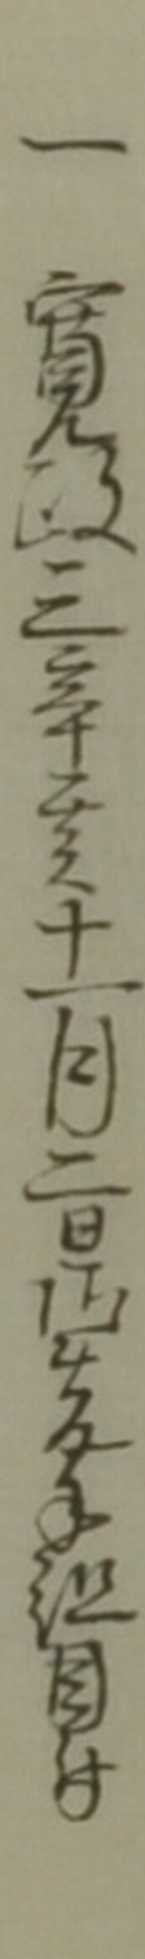一寛政三辛亥十一月二日御先手組目付
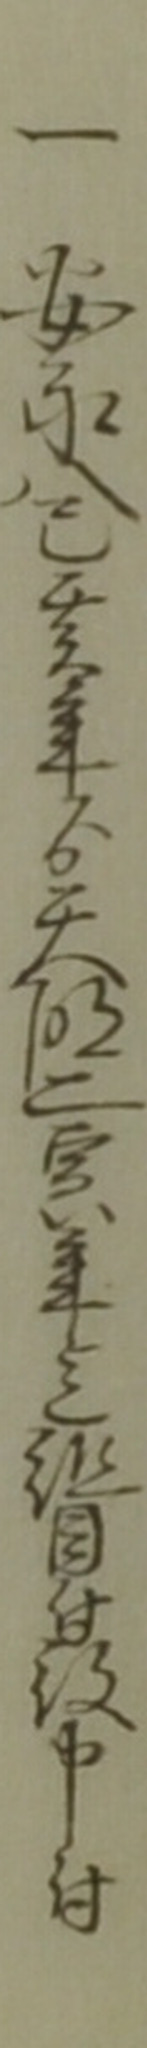一安永八巳其年ゟ天明二寅年迄組目付役申付
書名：無足諸士勤仕録（八）
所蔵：伊那市立高遠町図書館・合同会社AMANE
